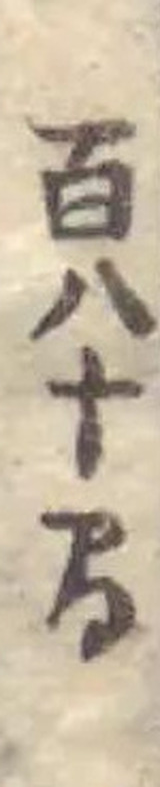百八十間
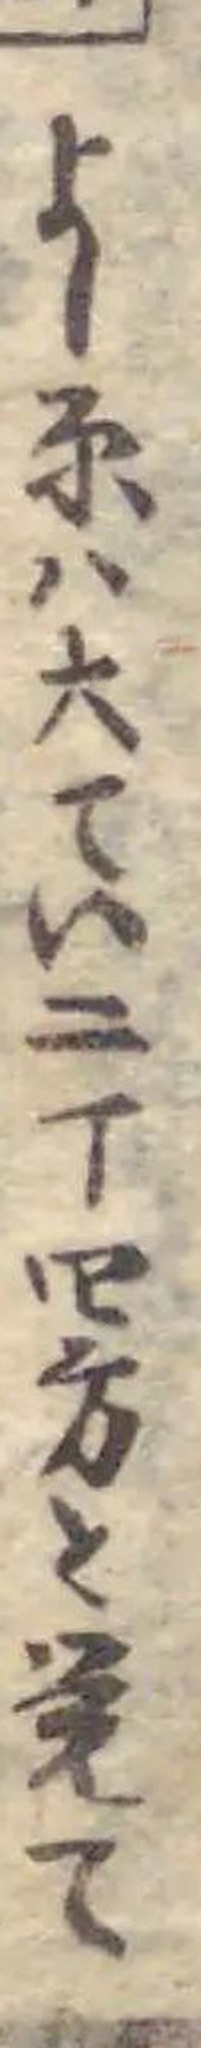よし原は大てい二丁四方と覚て
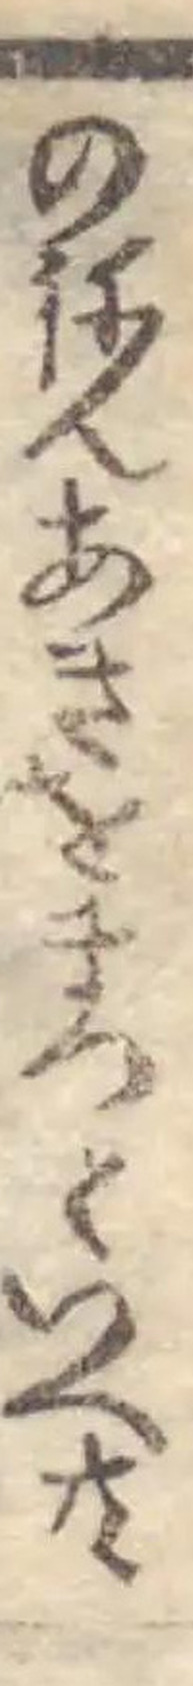のねんあきをまつといへ共
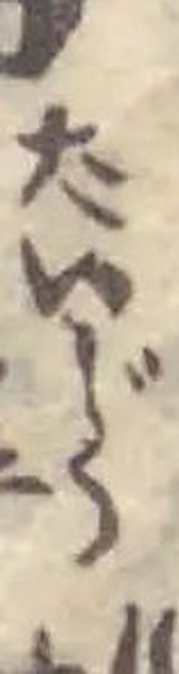たいじう
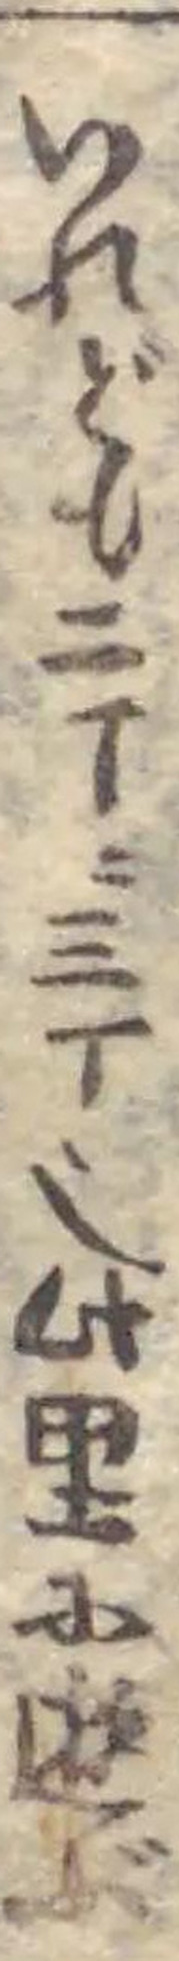いれども二丁に三丁也此里に遊ぶ
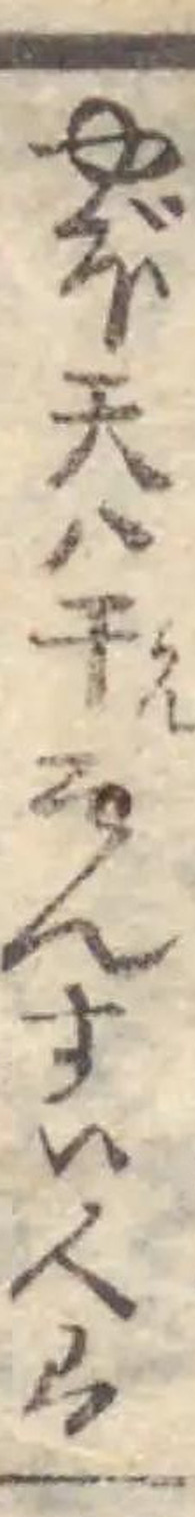いあぼ天は干そんすい人は
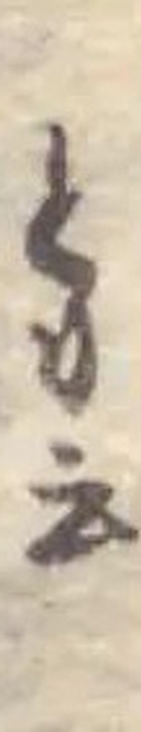とも云
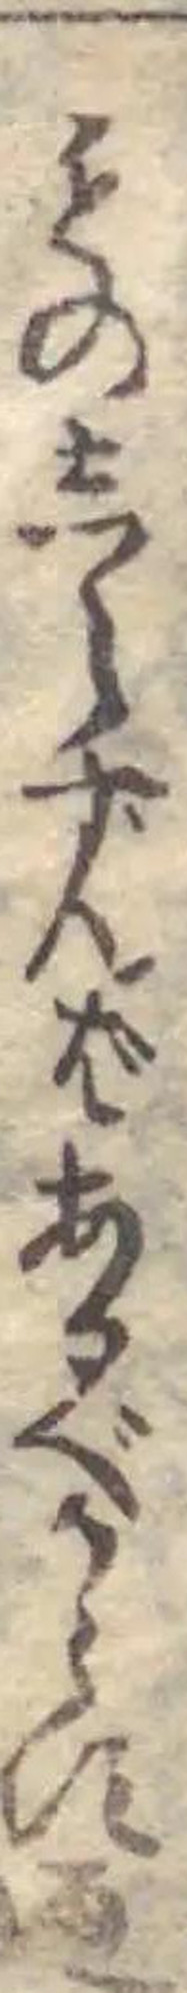ものしらずんばあるべからす通
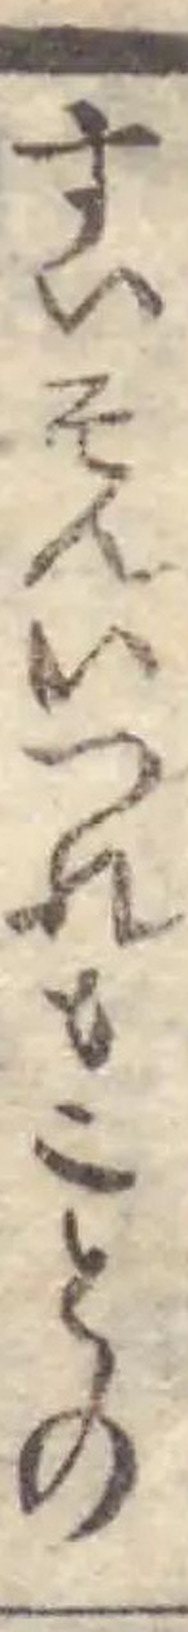すいそんいつれもことの
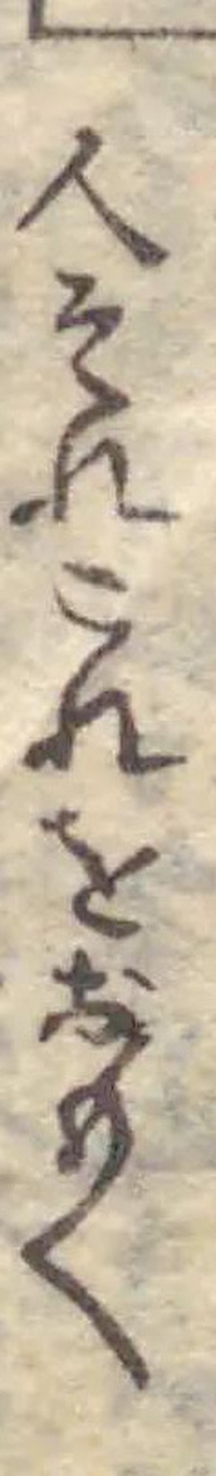人それこれをおもへ
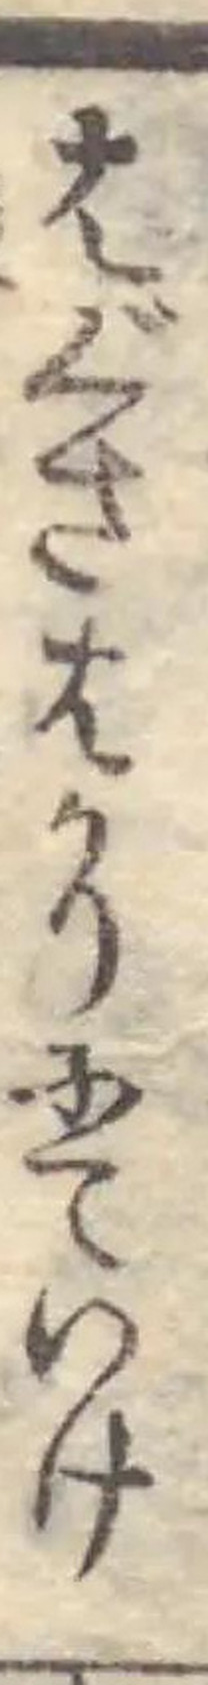はぐさはかりにていけ
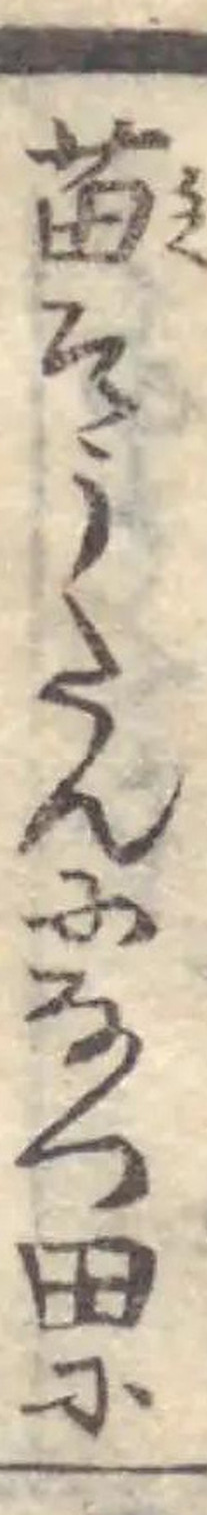苗そうたんになつ田に
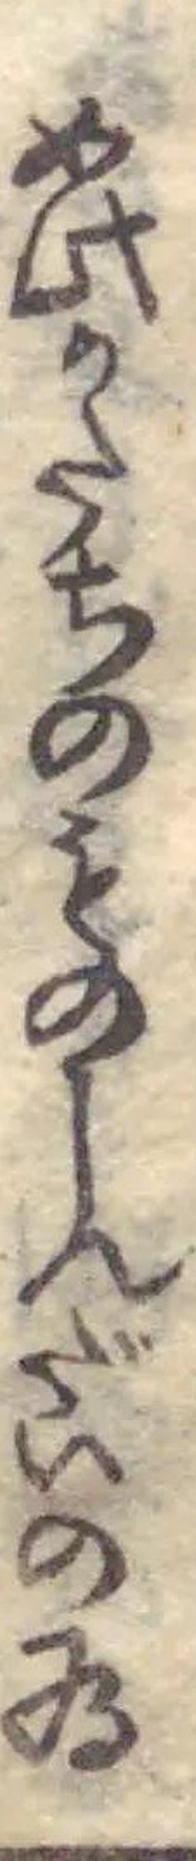如此かたちのものしんだいの為
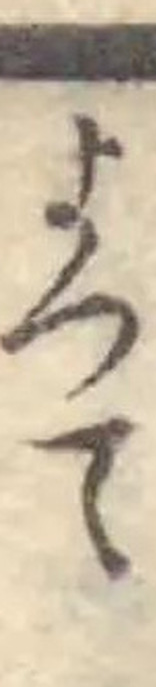よつて
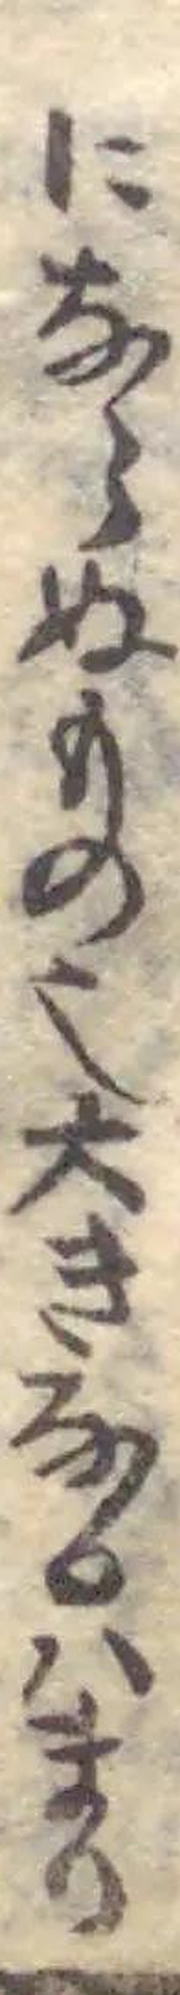にならぬもの也大きなるはまり
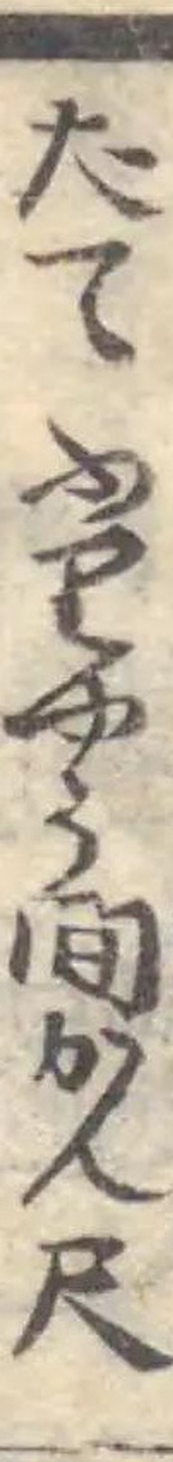たてふりやう間かん尺
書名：大通人好記
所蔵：国立国会図書館 National Diet Library, JAPAN
